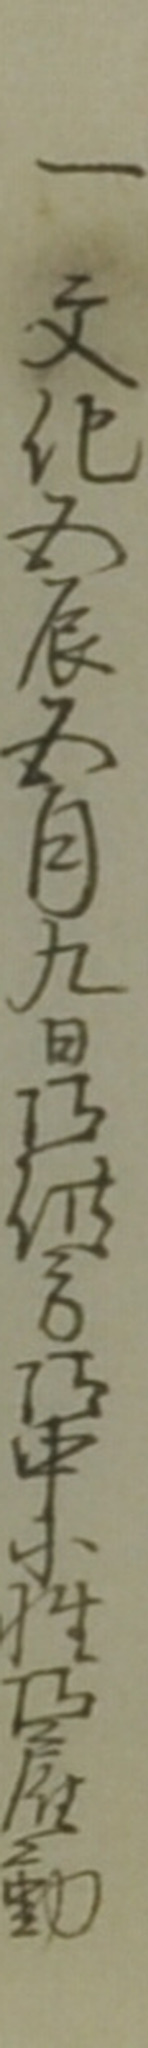一文化五辰五月九日お供方御中小性御雇勤
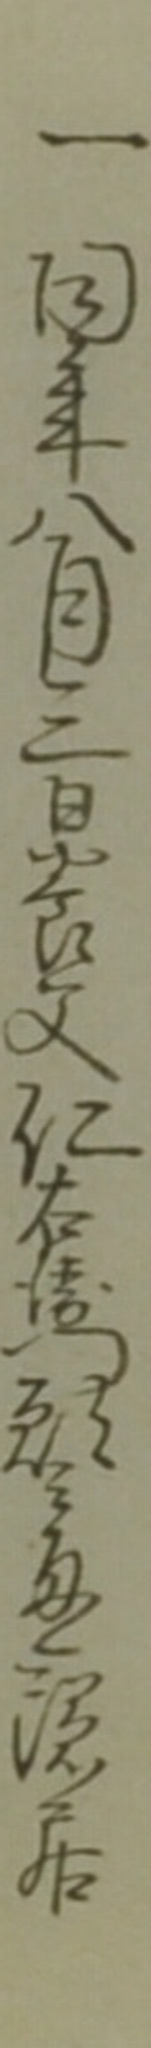一同年八月三日養父仁右衛門願之通隠居
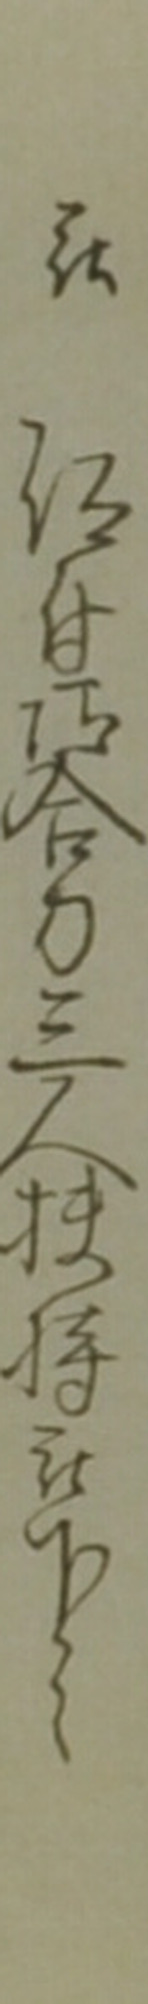被仰付御合力三人扶持被下候
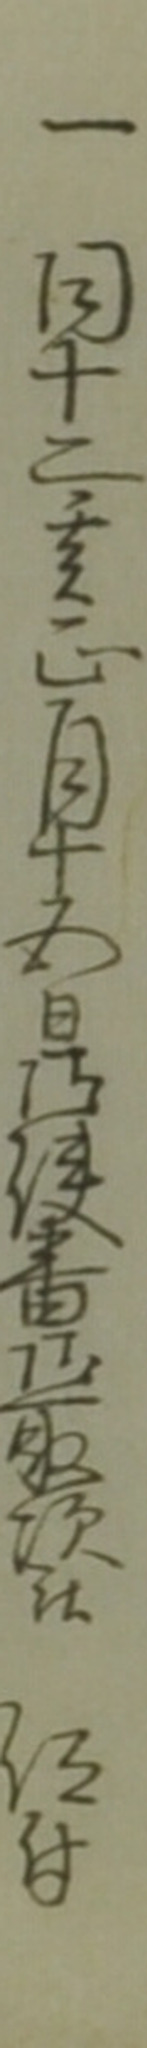一同十二亥正月十五日お使番御取次被仰付
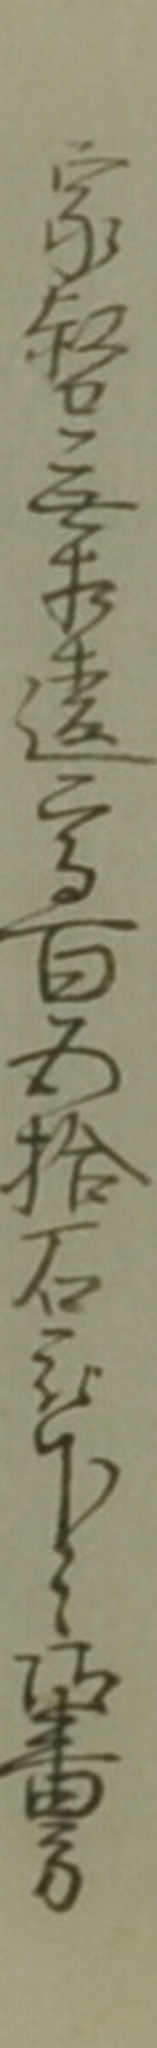家督無相違高百五拾石被下候御番方
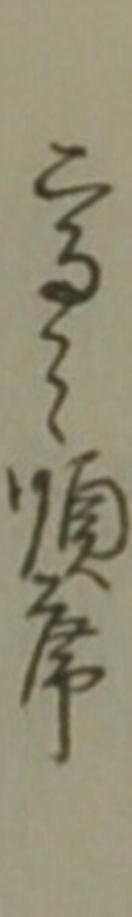高之順序
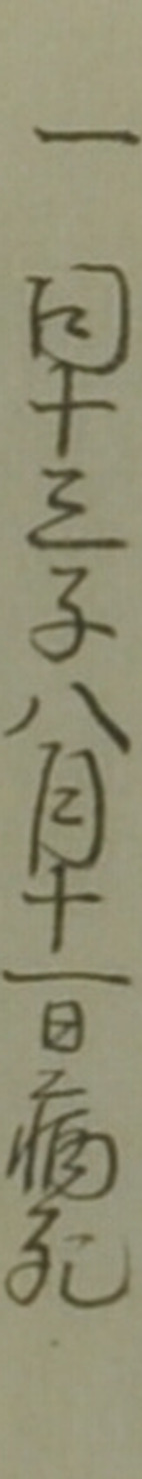一同十三子八月十一日病死
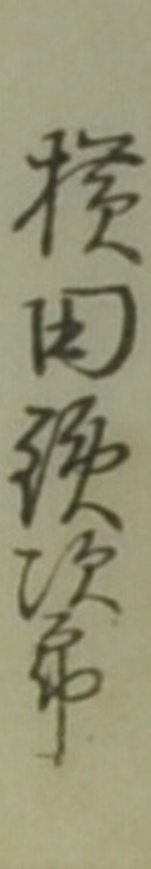横田鉄次郎

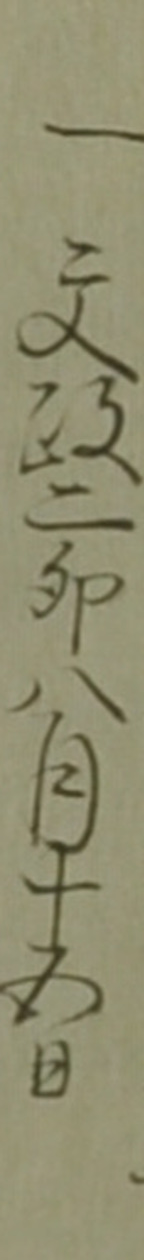一文政二卯八月十五日
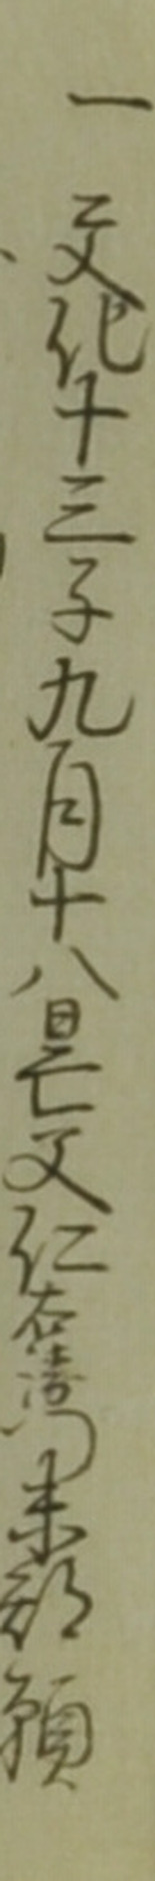一文化十三子九月十八日亡父仁右衛門末期願
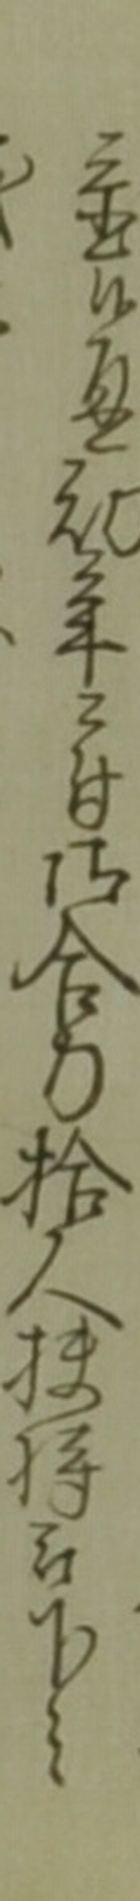置候通幼年ニ付御合拾人扶持被下候
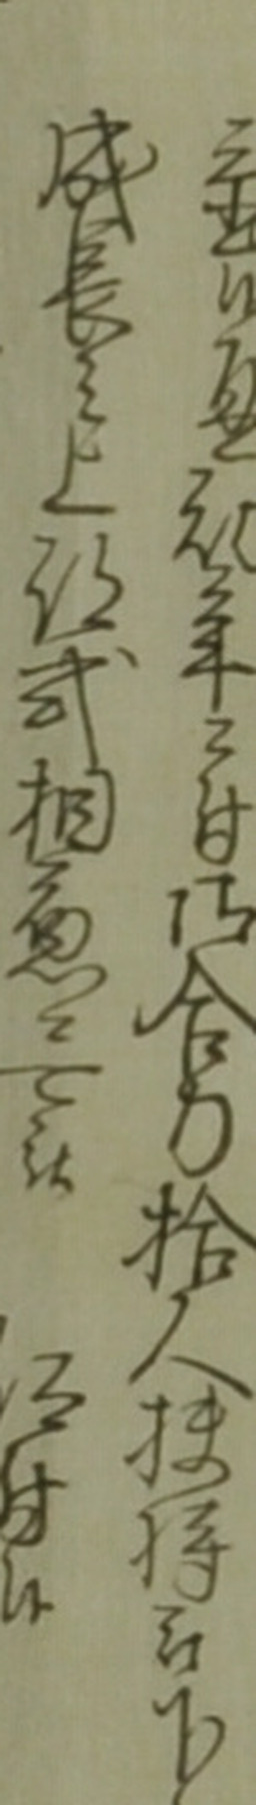成長之上役式相応二可被仰付候
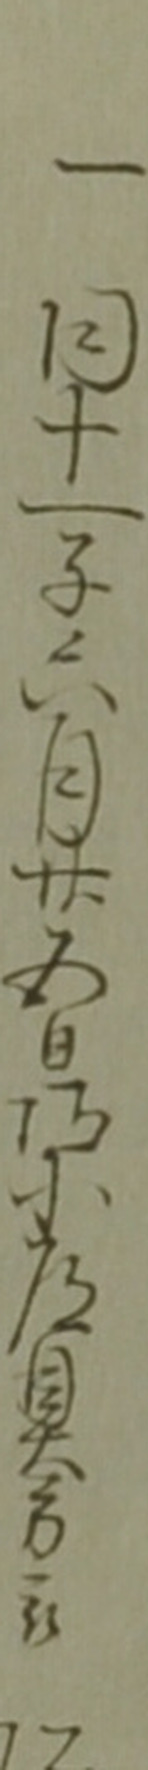一同十一子六月廿五日御小道具方被仰付
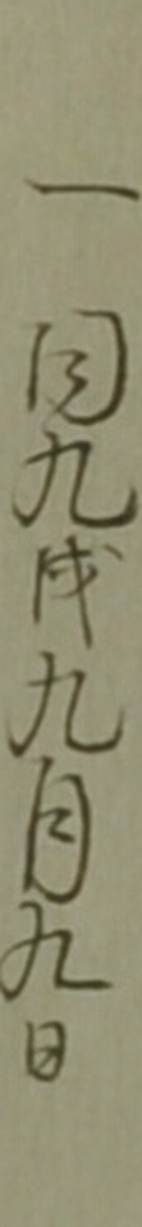一同九戊九月九日
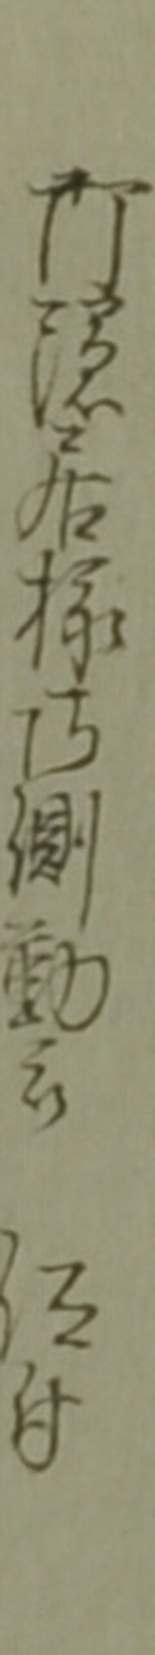御隠居様御側勤被仰付
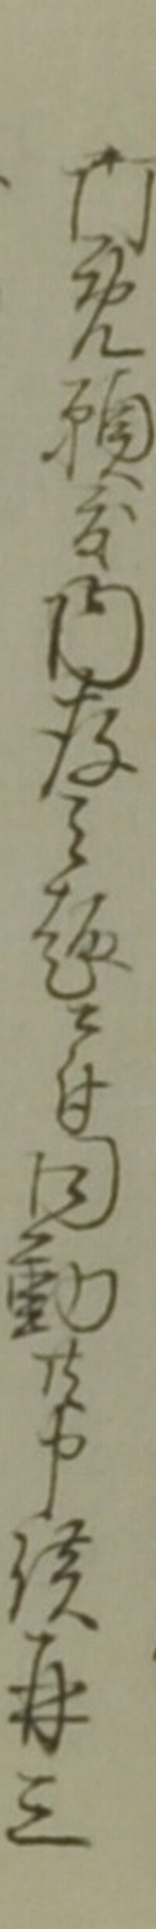御免願度御存之趣ニ付同勤共申請再三
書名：給人諸士勤仕録（三）
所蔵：伊那市立高遠町図書館・合同会社AMANE
